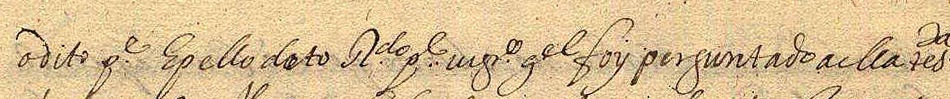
o dito p.e E pello dito R.do p.e uigr.o g.al foy perguntado a ella tes.ta
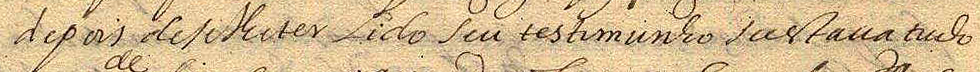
depois de se lhe ter Lido seu testimunho se estaua tudo
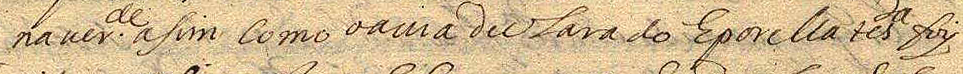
na uer.de asim como o auia declarado E por ella testa foy
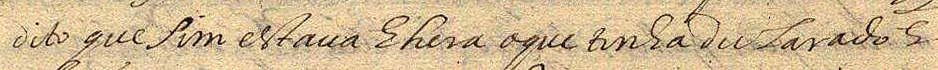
dito que sim estaua E hera o que tinha declarado E
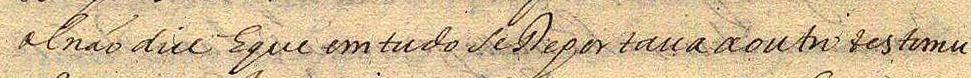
al naõ dice E que em tudo se Reportaua a outro testimu
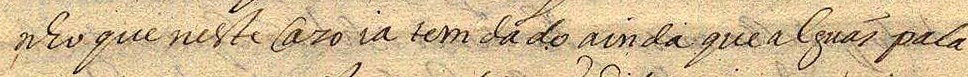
nho que neste Cazo ia tem dado ainda que alguās pala
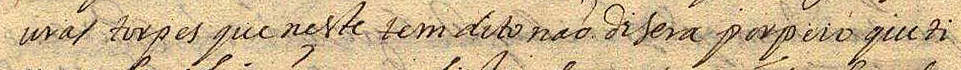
uras torpes que neste tem dito naõ disera por peio que ti
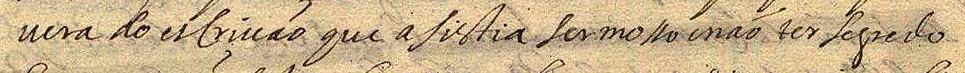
uera do esCriuaõ que asistia ser mosso e naõ ter segredo
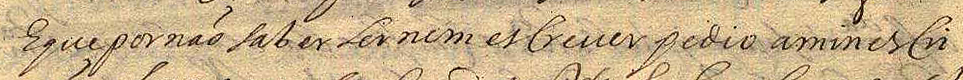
E que por naõ saber Ler nem esCreuer pedio a min esCri
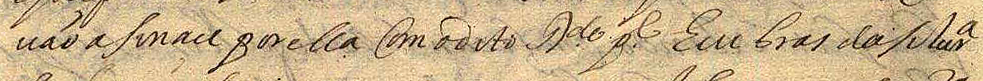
uaõ asinace por ella Com o dito R.do p.e E eu bras da Silura
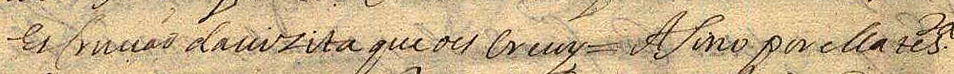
EsCriuaõ da uizita que o escreuy = Asino por ella testa
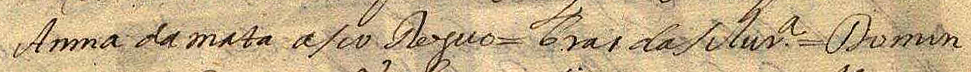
Anna da mata a seo Roguo = bras da Silura. Domin
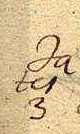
testa
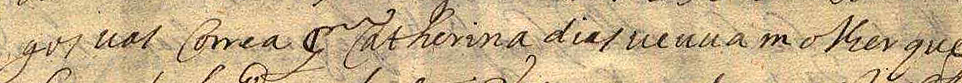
gos uas Correa ¶ Catherina dias ueuua molher que
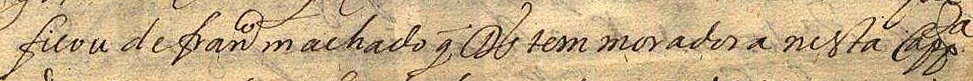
ficou de franco machado q̄ Ds̄ tem moradora nesta Cappta
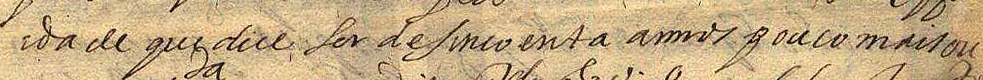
idade que dice ser de sincoenta annos pouco mais ou
